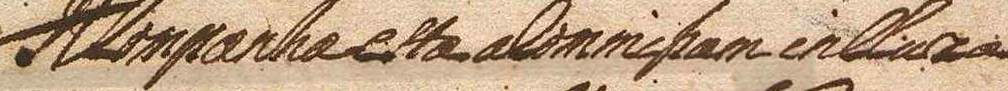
Acompanha esta a Commissam inCluza
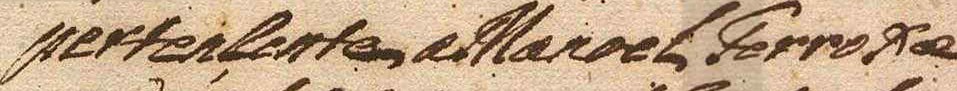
pertenÇente a Manoel Ferro Xa
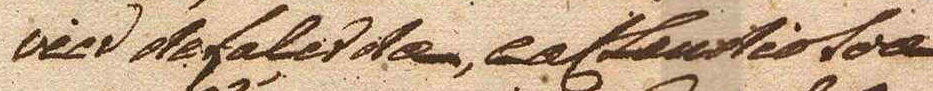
vier de LaÇerda, e a CLaudio Soa
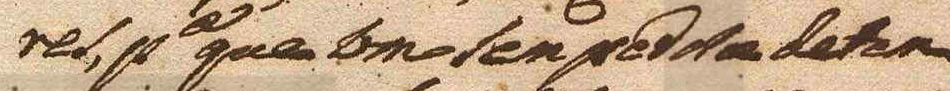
res, pa que vm sem perda de tem
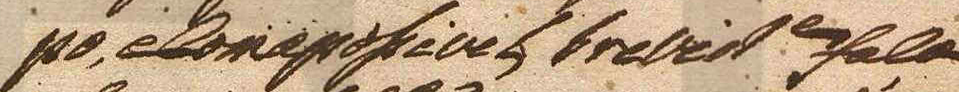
po, e Com a possivel, brevide faÇa
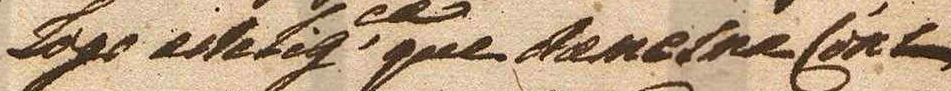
Logo a deligça que da mesma Cons
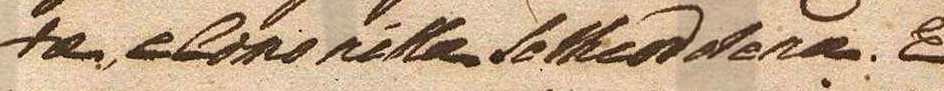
ta, e Como nélla se lhe ordena. E
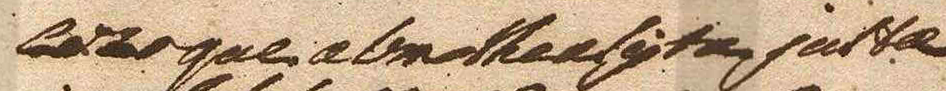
cazo que a vm lhe asista justa
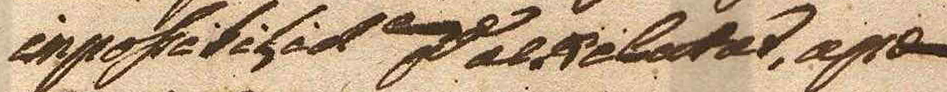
impossibilide pa a exeCutar, a po
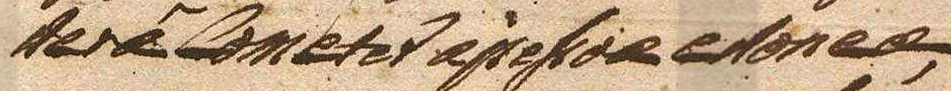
derá Cometer a pessoa edonea,
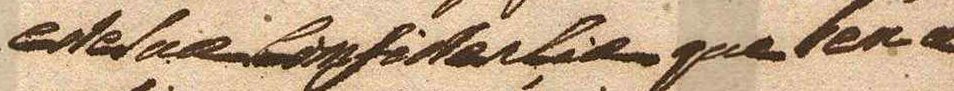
e de sua ConfidenÇia, que bem a
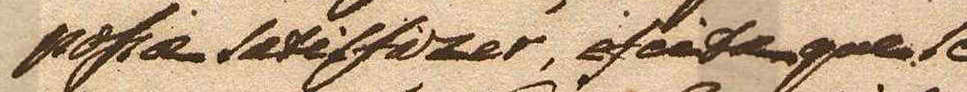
possa satisfazer, e feita que se
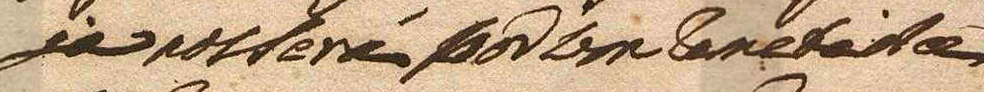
ja nos será por vm Remetida
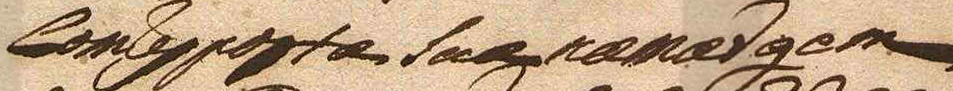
Com Resposta sua na margem
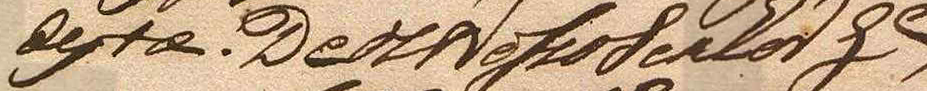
desta. Deos Nosso Senhor Ge
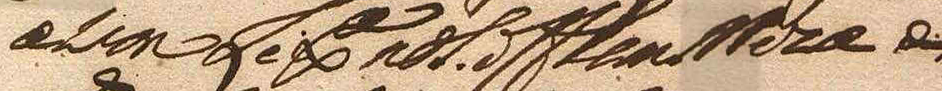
a vm Lixa no S. offo em Meza a
